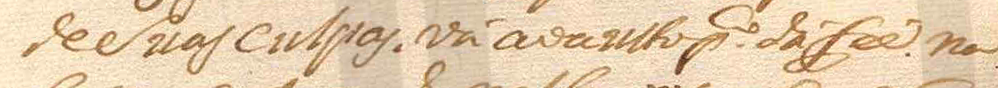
de suas culpas, vá ao autto p.co da fee na
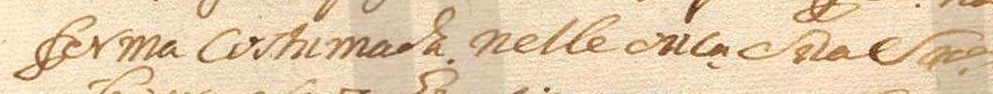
forma costumada. nelle ouça sua Sn.ca
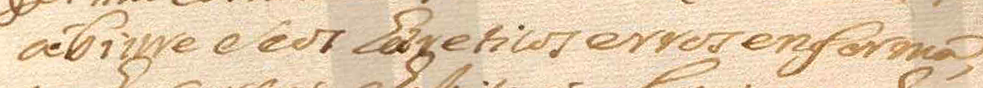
abiure seos hereticos erros en forma,
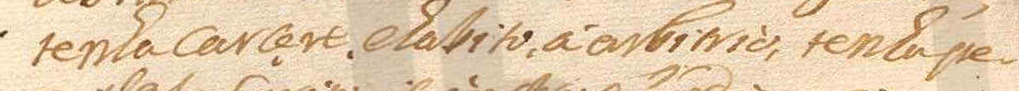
tenha carcere, e habito, á arbitrio, tenha pe
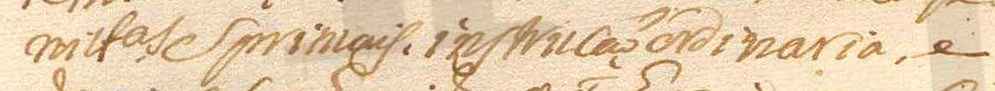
nittas. spirituais. instruçaõ ordinaria, e
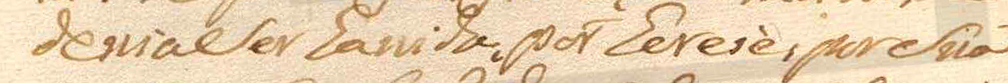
deuia ser hauida, por hereie, por Sua
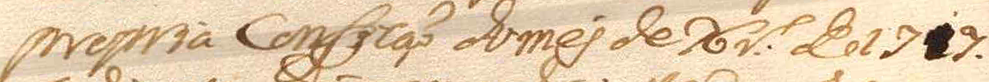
propria Confiçaõ do mes de Xr.o de 17_7.
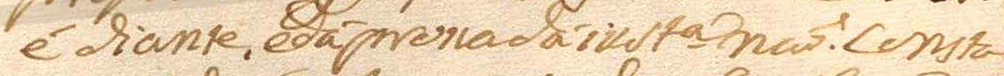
ē diante, e da proua da iusta naõ consta
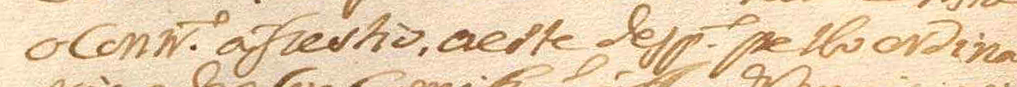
o Contr.o assestio, a este desp.o pello ordina
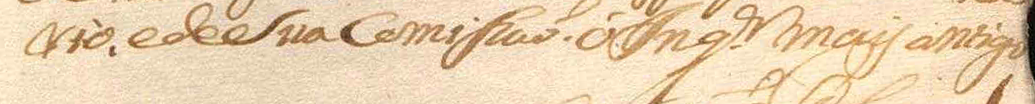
rio, e de sua comissaõ. o Inq.or mais antigo
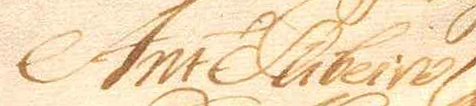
Anto Ribeiro
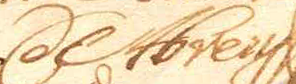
de Abreu
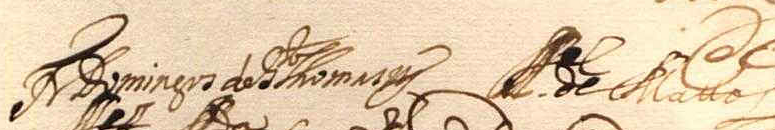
Fr Domingos de Sto Thomas Mel de Mattos
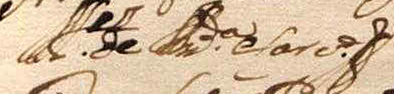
M.el de Alm.da e Carv.o
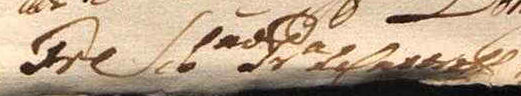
Fr Sebao Pr.a de Castro
